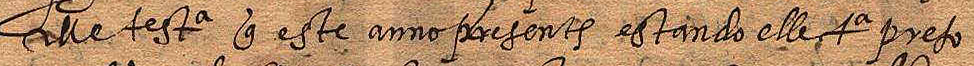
elle testa q̄ este anno presentꝭ estando elle ta preso
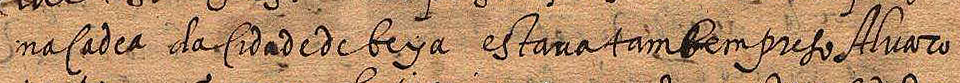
na Cadea da Cidade de beya estaua tambem preso Aluaro
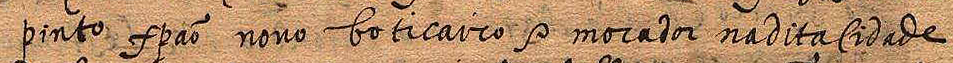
pinto xpaõ nouo boticairo e morador na dita cidade
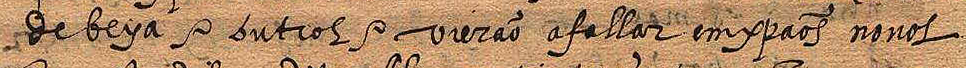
de beya e outros e vieraõ a fallar em xpaõs nouos
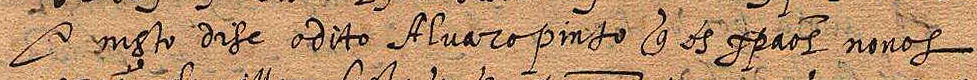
e nisto dise o dito Aluaro pinto q̄ os xpaõs nouos
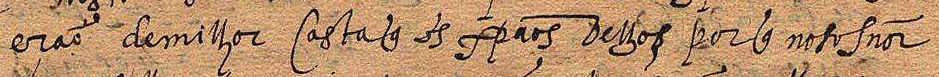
eraõ de milhor Casta q̄ os xpaõs velhos porq̄ noso snōr
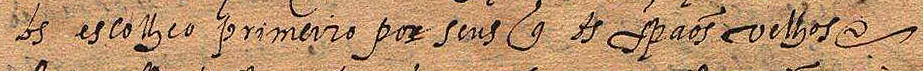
os escolheo primeiro por seus q̄ os xpaõs velhos e
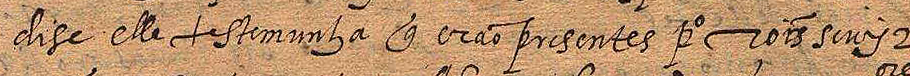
dise elle testemunha q̄ eraõ presentes po rois̄ seu yr
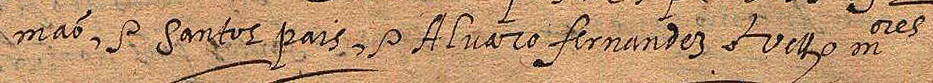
maõ, e Santos pais, e Aluaro fernandez o velho mores
